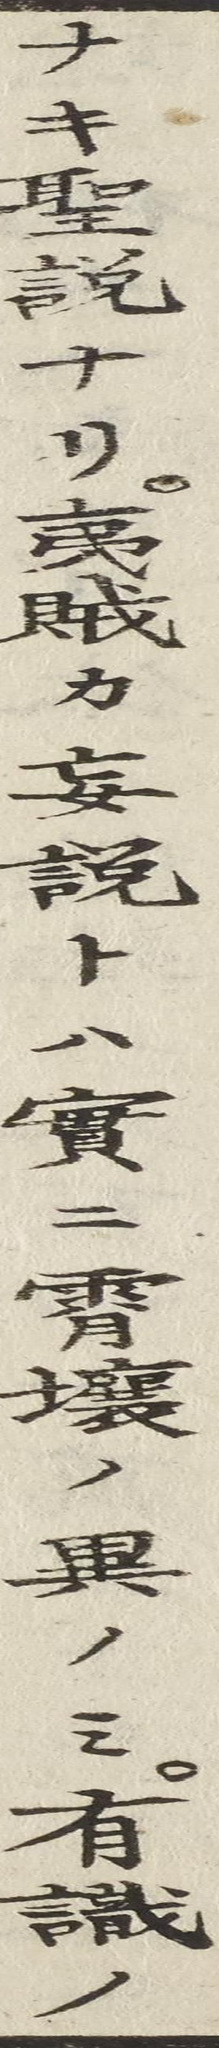ナキ聖説ナリ。夷賊カ妄説トハ実ニ霄壌ノ異ノミ。有識ノ
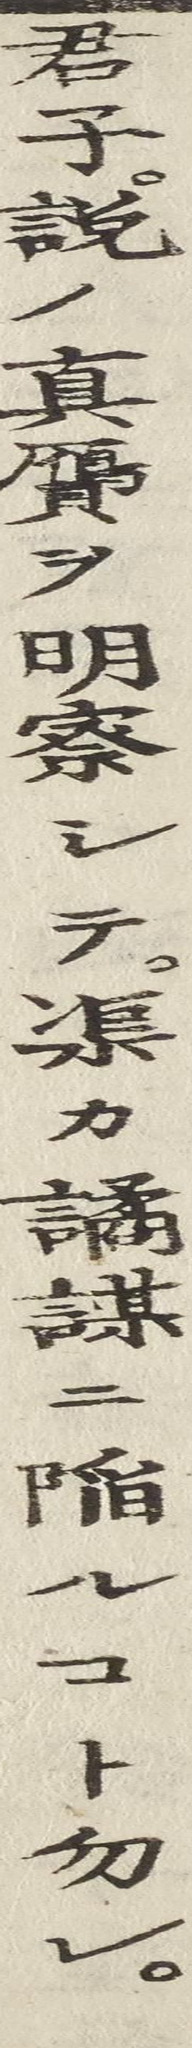君子。説ノ真贋ヲ明察シテ。渠カ譎謀ニ陥ルコト勿レ。
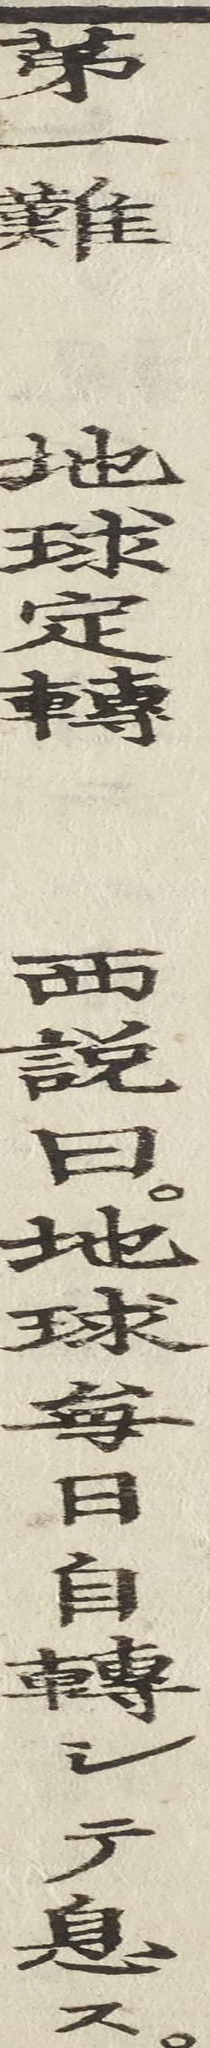第一難地球定転西説曰。地球毎日自転シテ息ス。
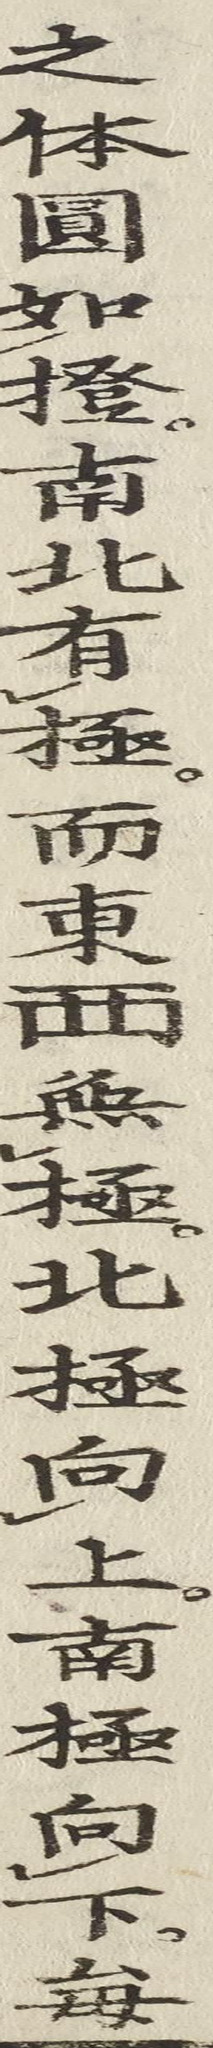之体円如橙。南北有極。而東西無極。北極向上。南極向下。毎
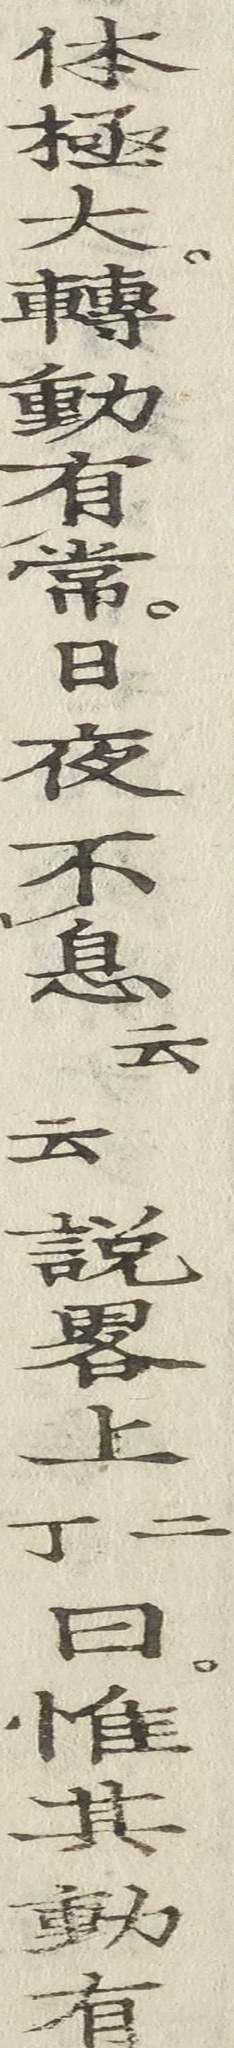体極大。転動有常。日夜不息云云説略上ニ丁曰。惟其動有常。
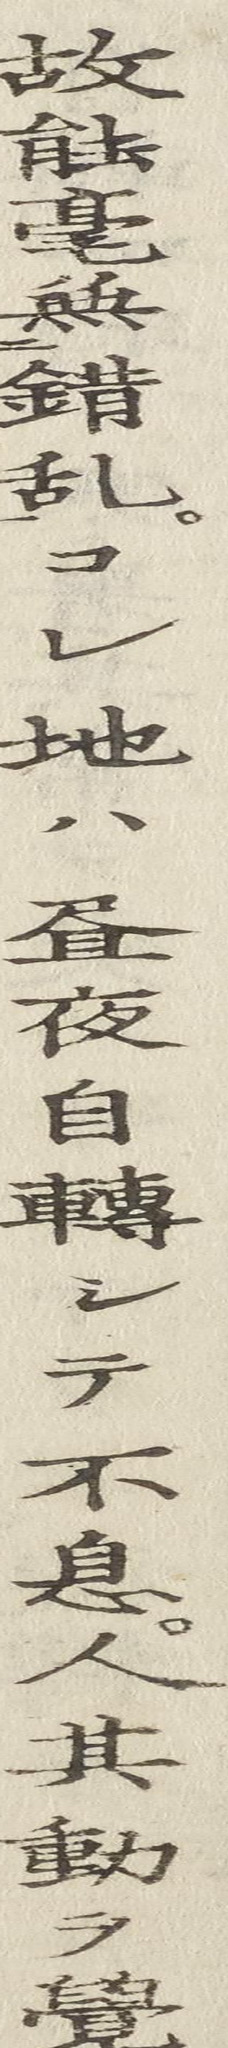故能毫無ニ錯乱。コレ地ハ昼夜自転シテ不息。人其動ヲ覚
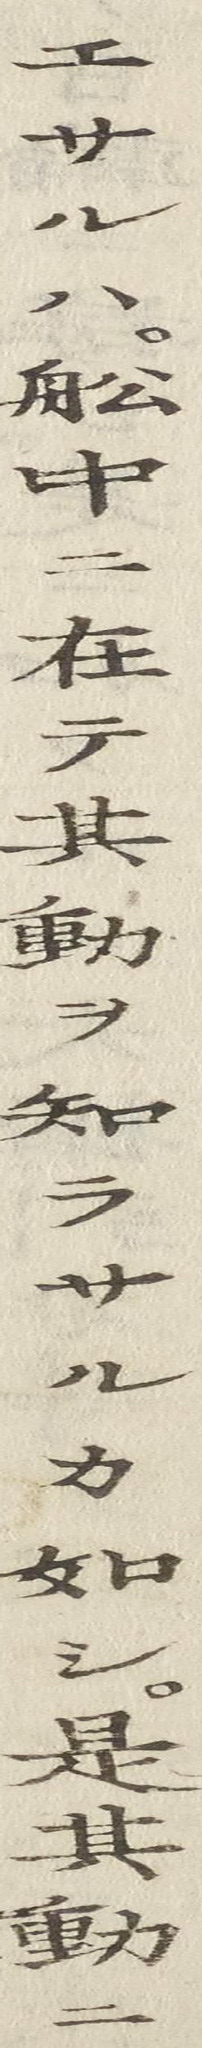エサルハ。船中ニ在テ其動ヲ知ラサルカ如シ。是其動ニ
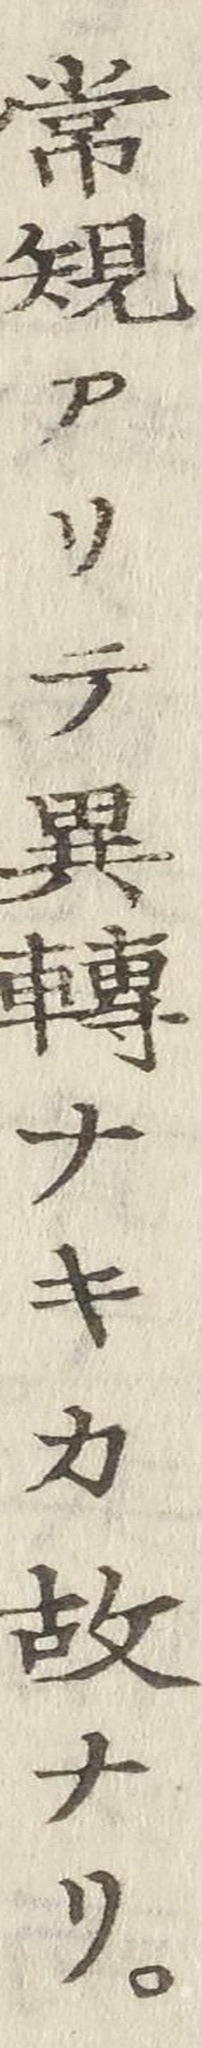常規アリテ異転ナキカ故ナリ。
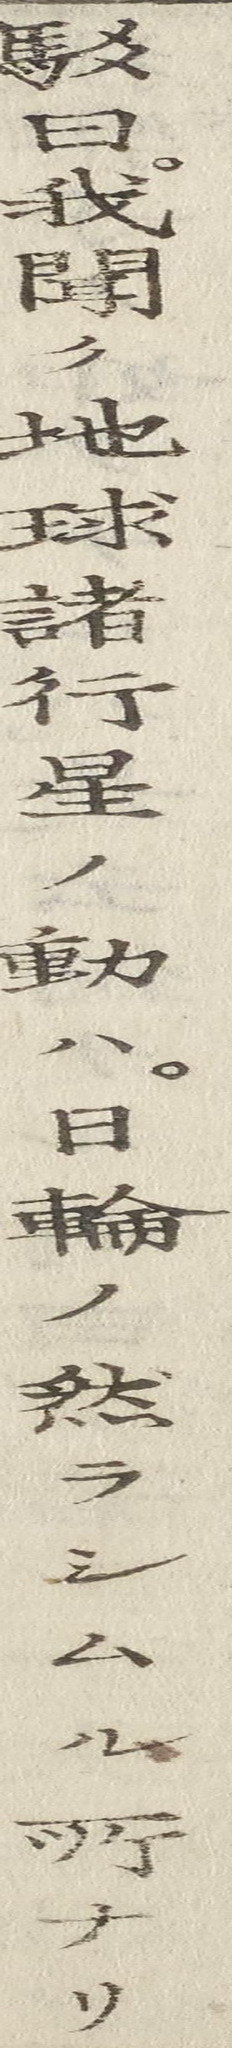駁曰。我聞ク地球諸行星ノ動ハ。日輪ノ然ラシムル所ナリ

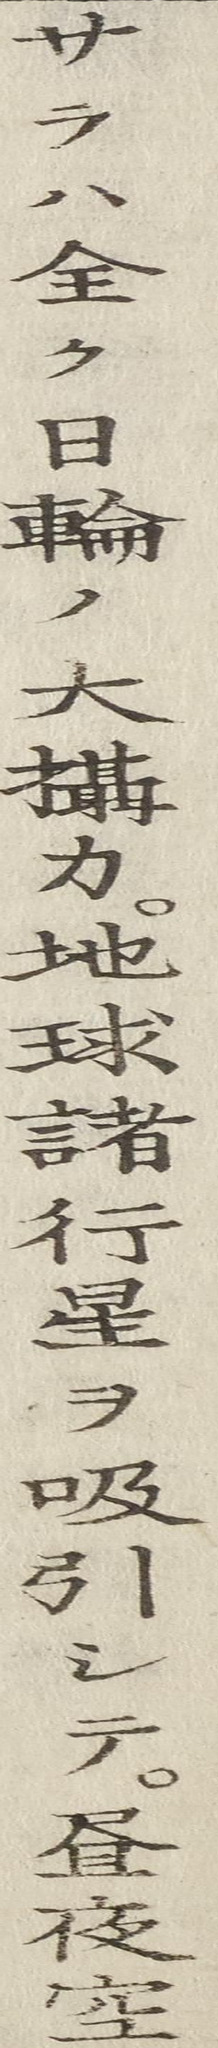サラハ全ク日輪ノ大摂カ。地球諸行星ヲ吸引シテ。昼夜空
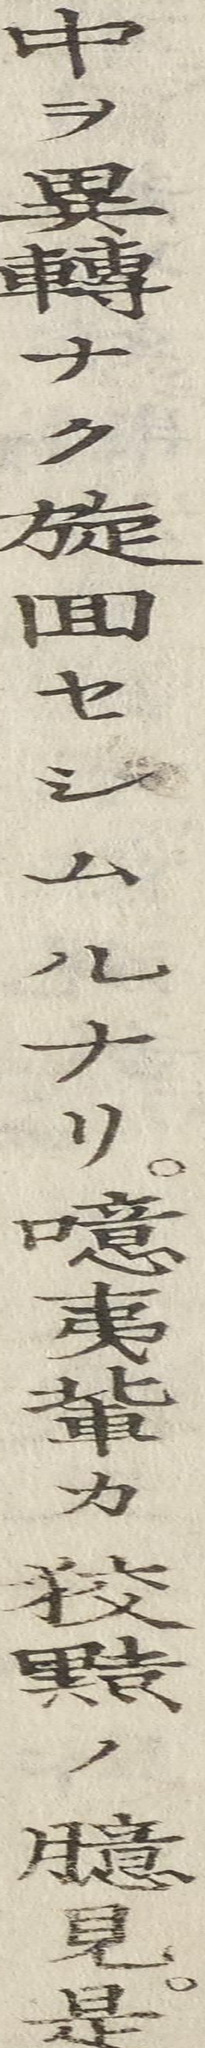中ヲ異転ナク旋回セシムルナリ。噫夷輩カ狡黠ノ臆見。是
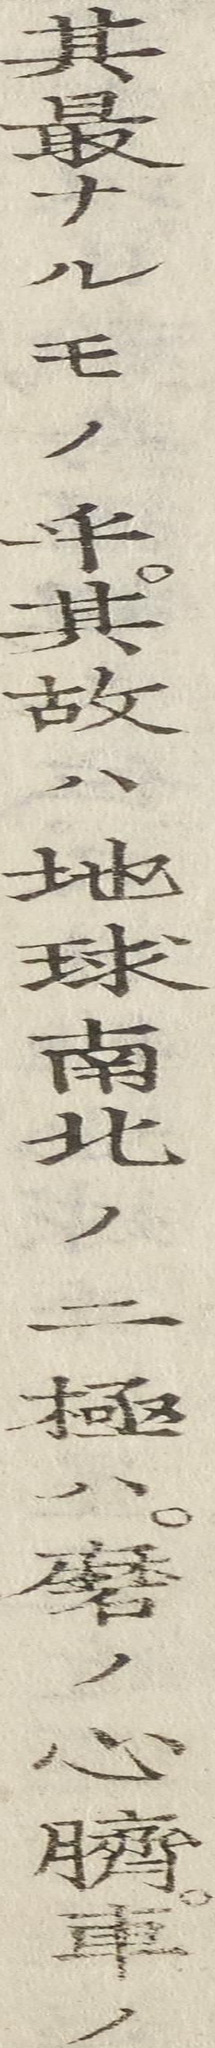其最ナルモノ乎。其故ハ地球南北ノニ極ハ。麿ノ心臍。車ノ
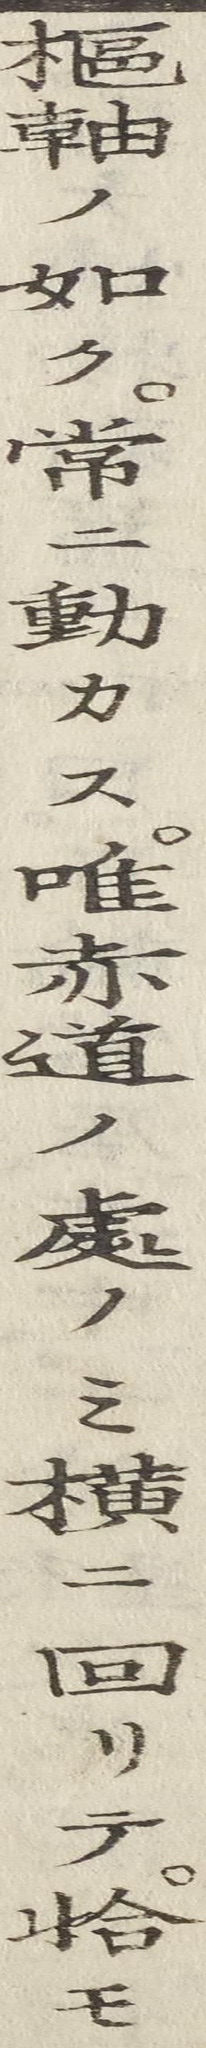枢軸ノ如ク。常ニ動カス。唯赤道ノ処ノミ横ニ回リテ。恰モ
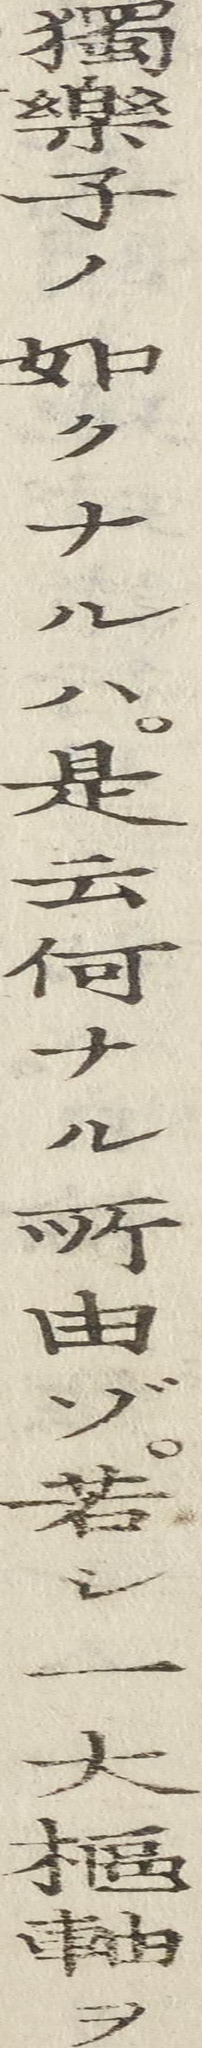独楽子ノ如クナルハ。是云何ナル所由ゾ。若シ一大枢軸ヲ
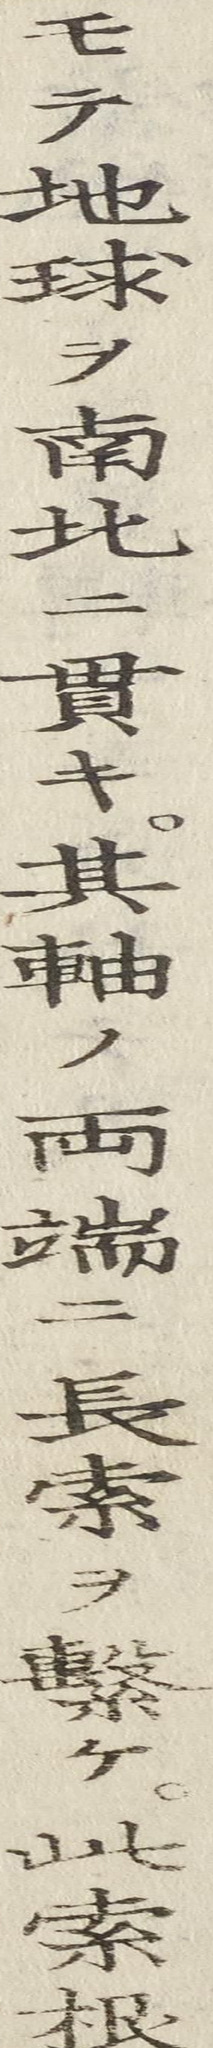モテ地球ヲ南北ニ貫キ。其軸ノ両端ニ長索ヲ繋ケ。此索根
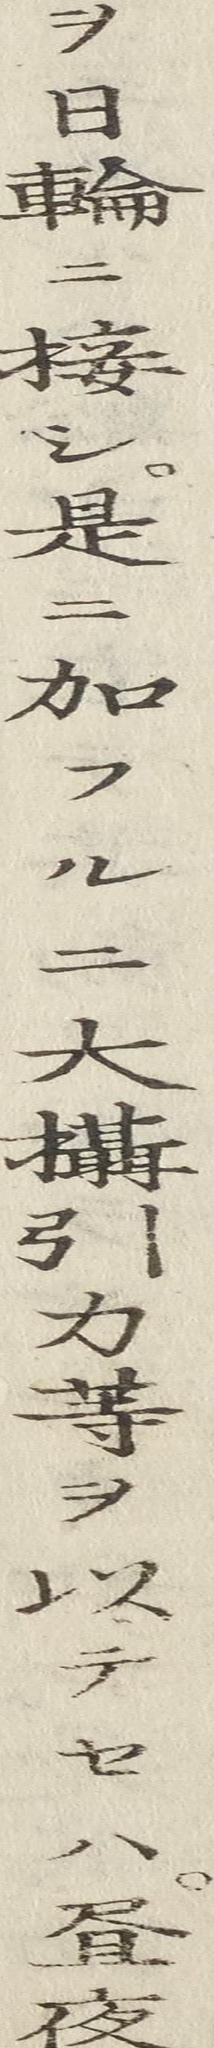ヲ日輪ニ接シ。是ニ加フルニ大摂引力等ヲ以テセハ。昼夜
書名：護法新論　二編　下
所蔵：東京大学地震研究所図書室 Earthquake Research Institute Library, The University of Tokyo, JAPAN
